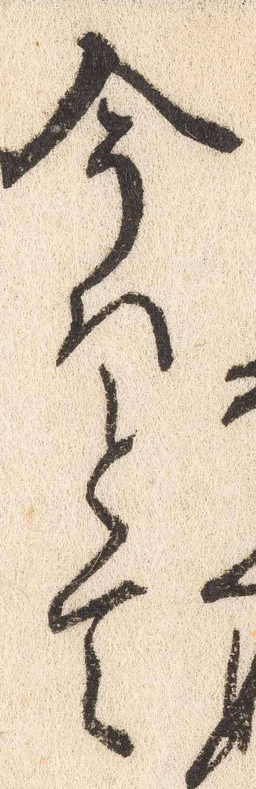今はとて
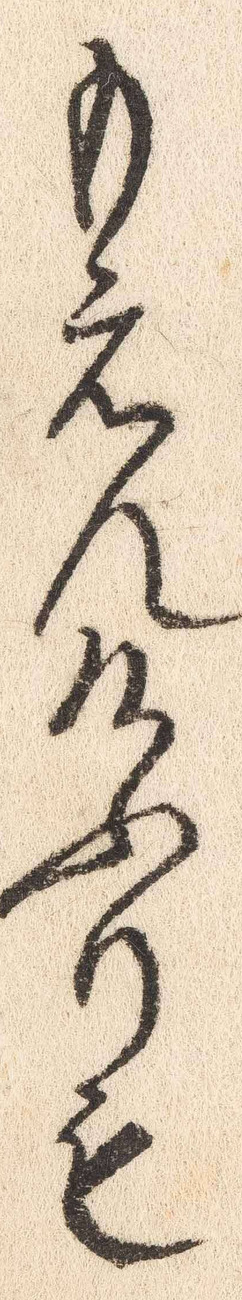もえんけふりも
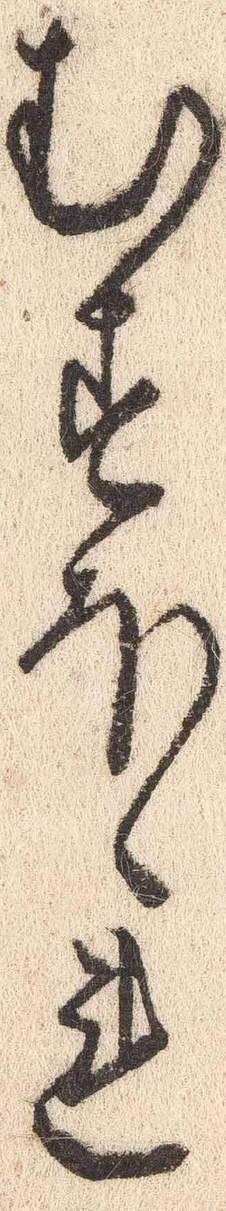むすほゝれ

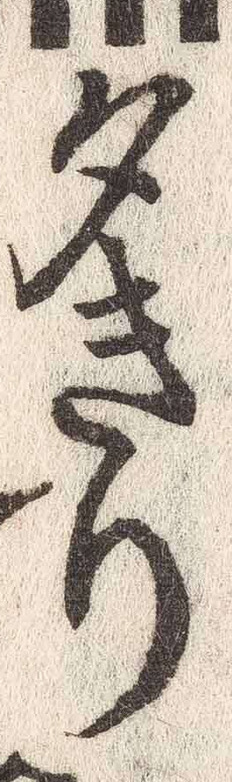夕きり

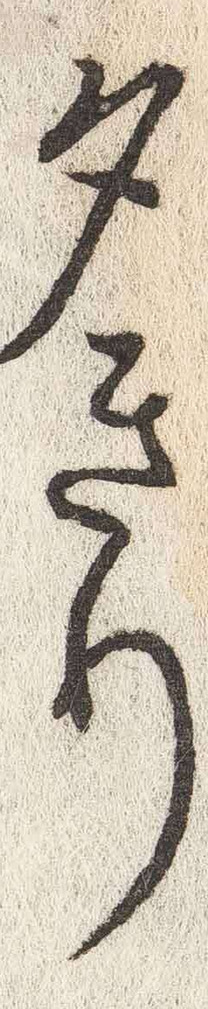夕きり
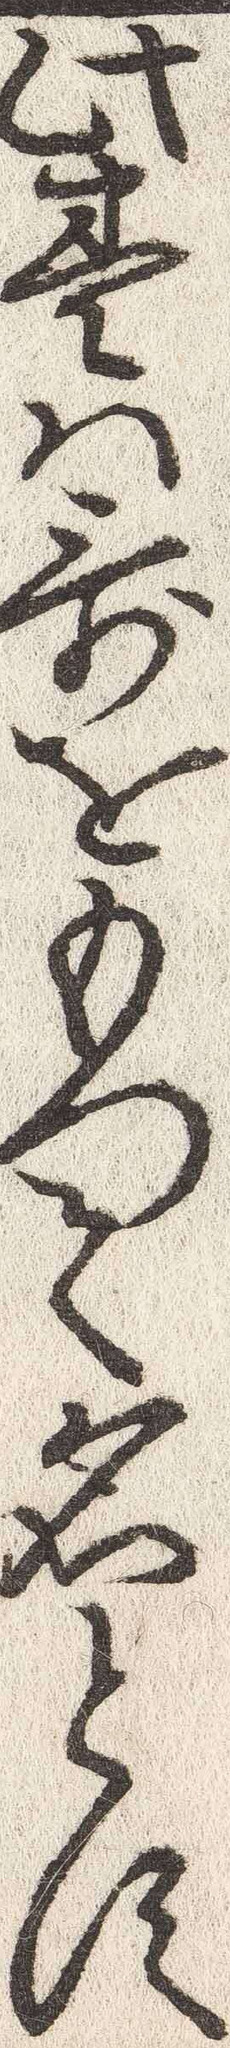此巻は哥をもつて名とす
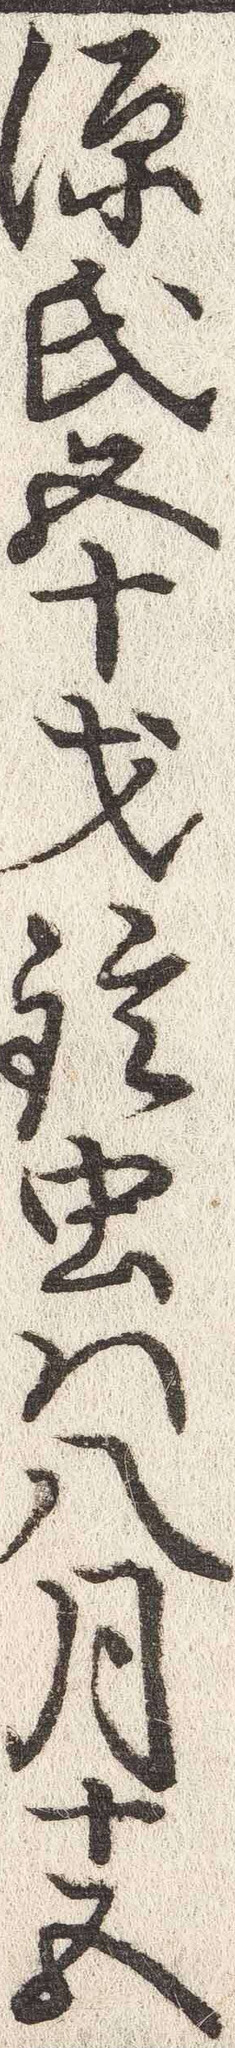源氏五十才鈴虫は八月十五
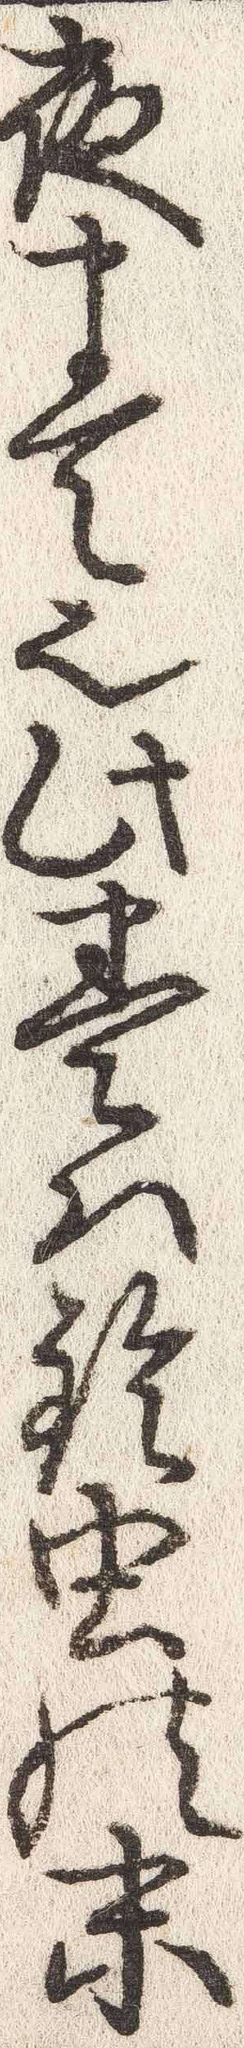夜まて也此巻は鈴虫の末
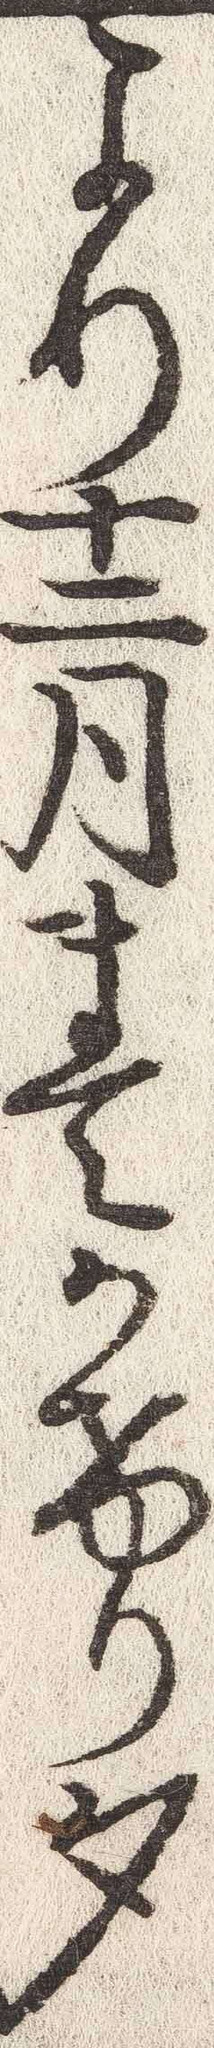より十二月まてかけり夕
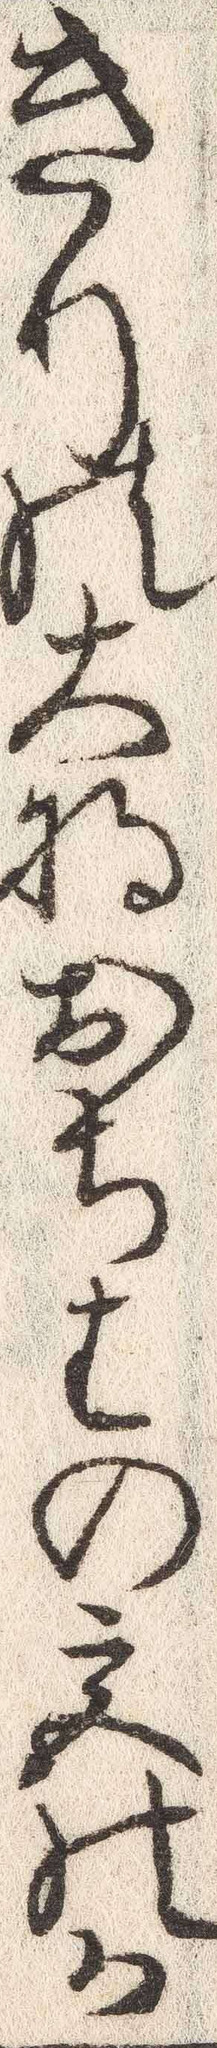きりの大将おちはの宮のか
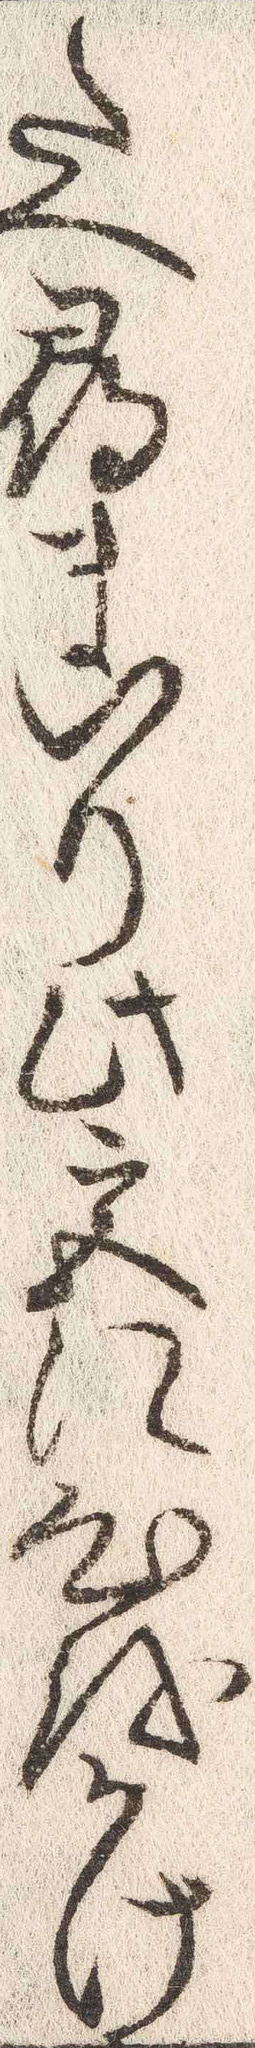たへ尋まいり此宮に心をかけ
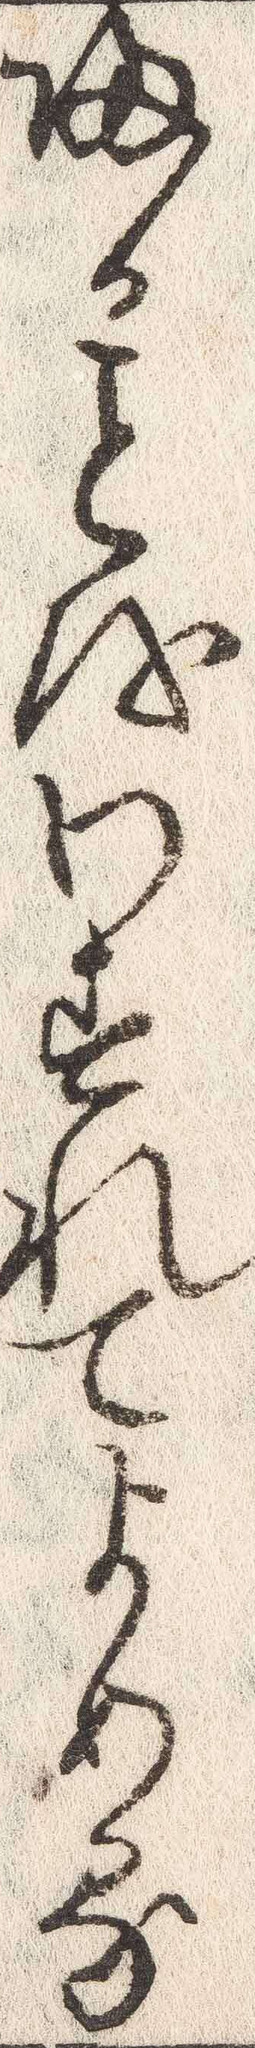帰ることをわすれてよめる
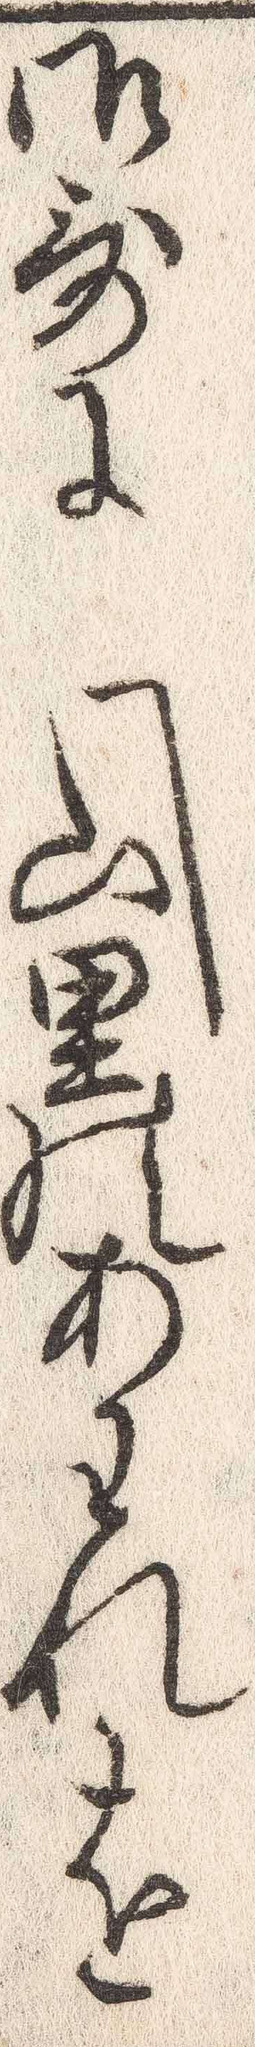御哥に〽︎山里のあわれを
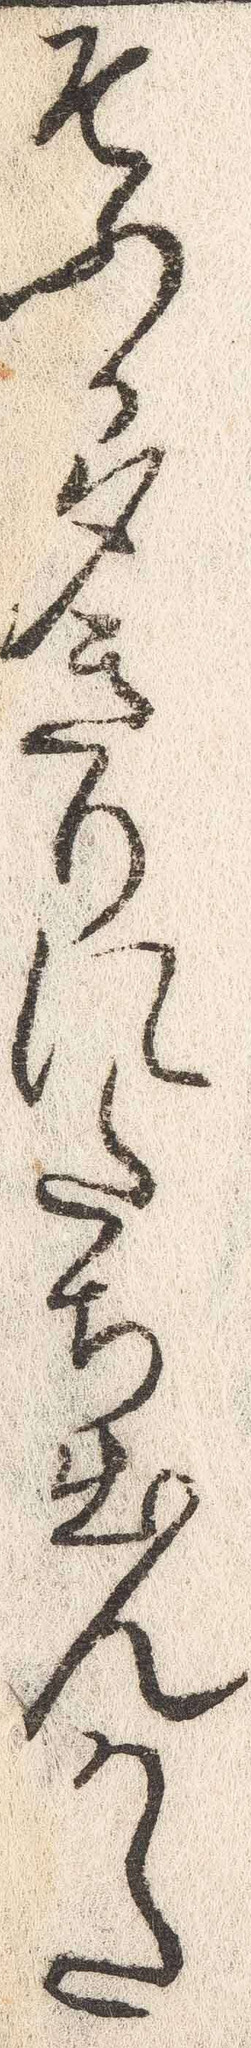そふる夕きりにたち出んかた

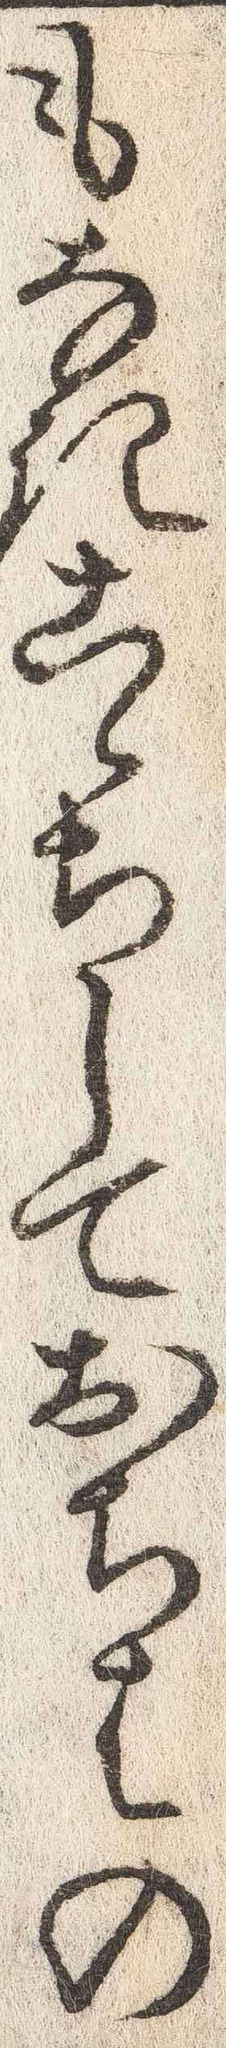もなきこゝ地しておちはの
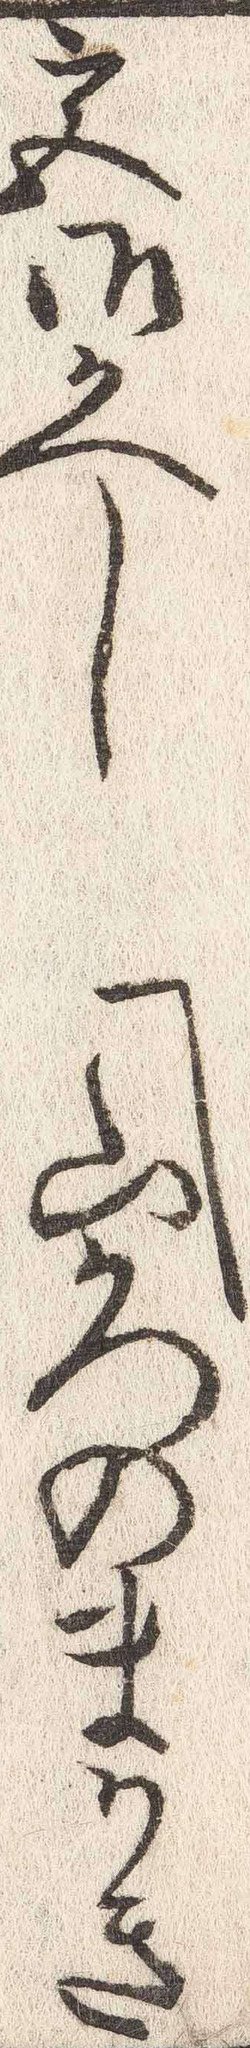宮御かへし〽︎山かつのまかき
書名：源氏物語
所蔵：東京学芸大学附属図書館 国文学研究資料館
